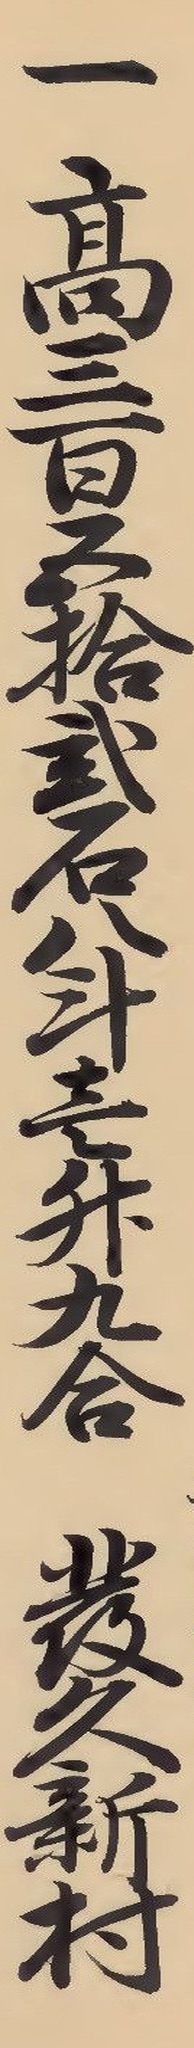一高三百五拾弐石八斗壱升九合発久新村
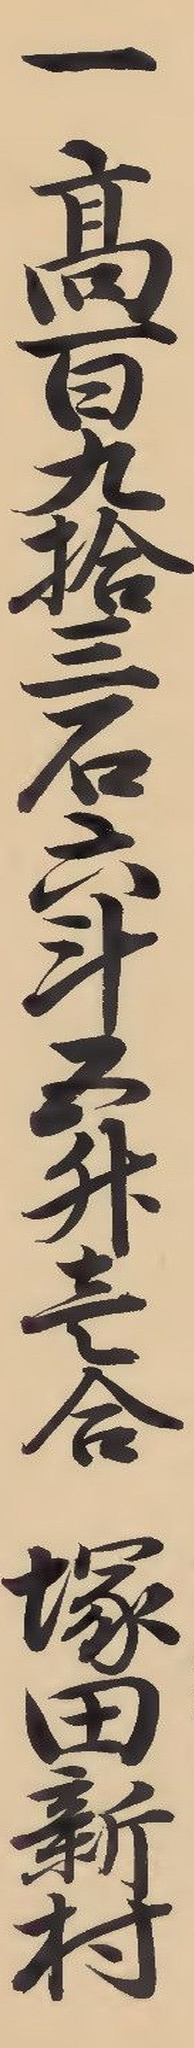一高百九拾三石六斗五升壱合塚田新村

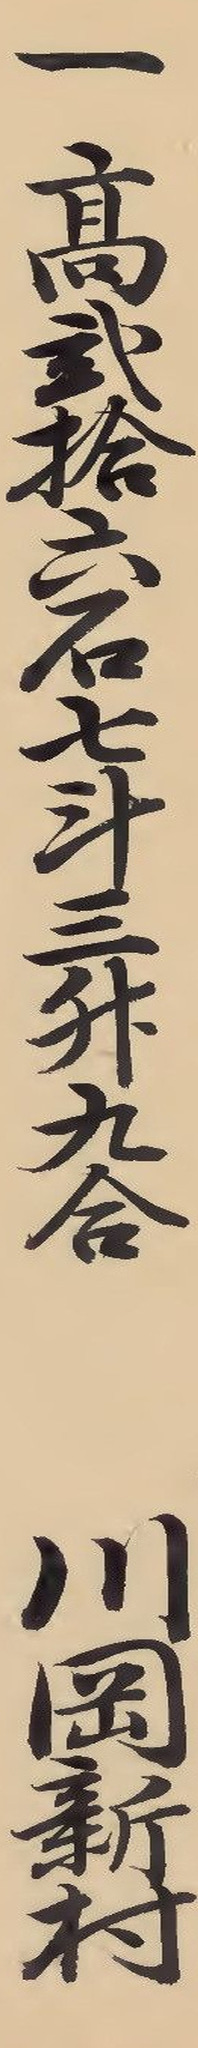一高弐拾六石七斗三升九合川岡新村
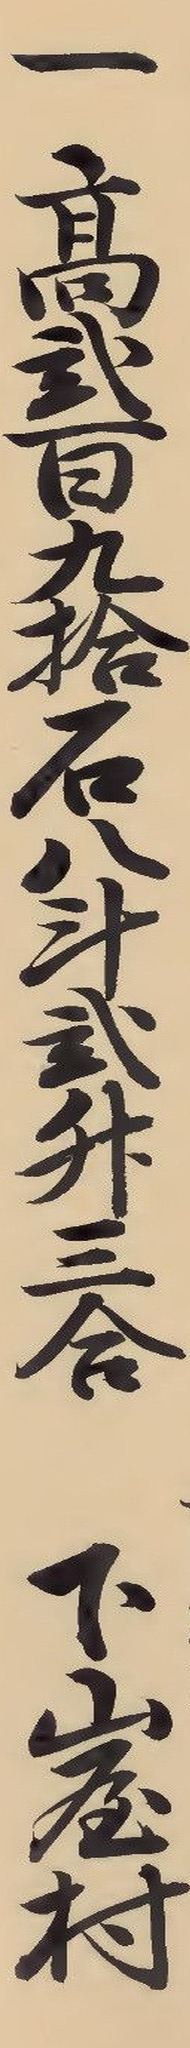一高弐百九拾石八斗弐升三合下山屋村
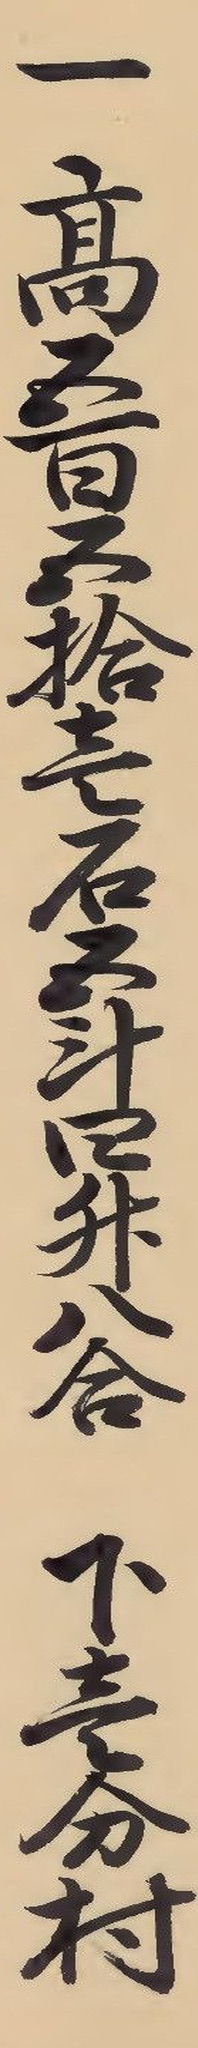一高五百五拾壱石五斗四升八合下壱分村
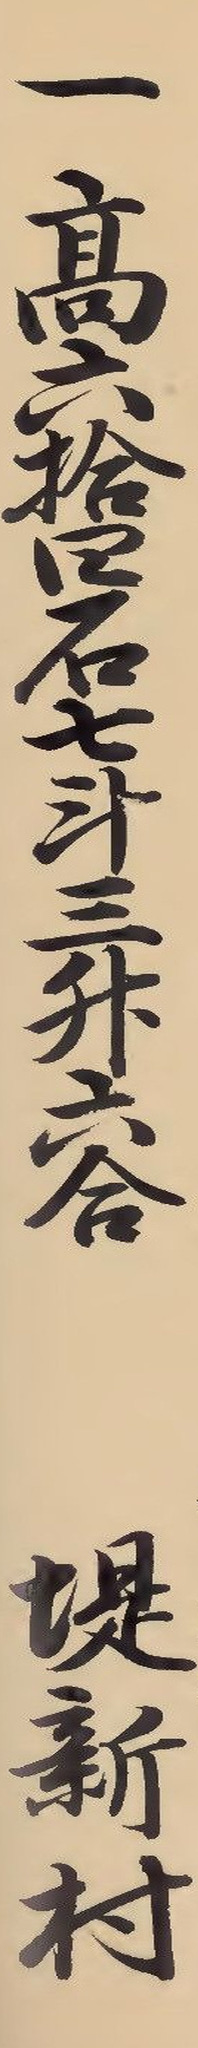一高六拾四石七斗三升六合堤新村
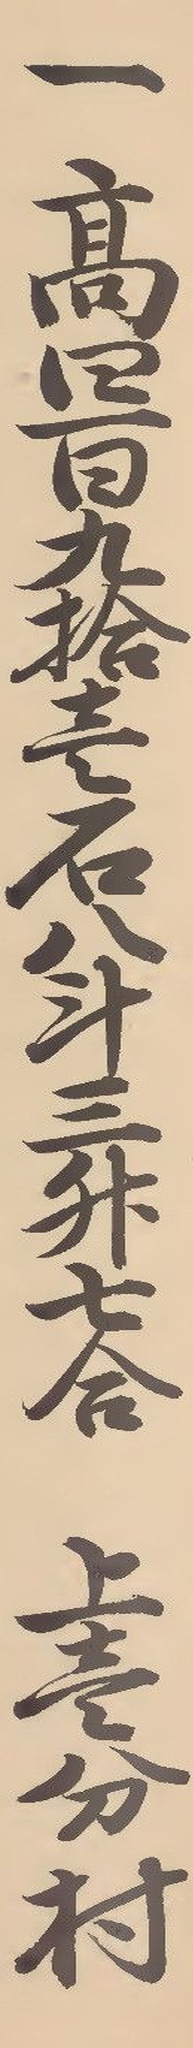一高四百九拾壱石八斗三升七合上壱分村
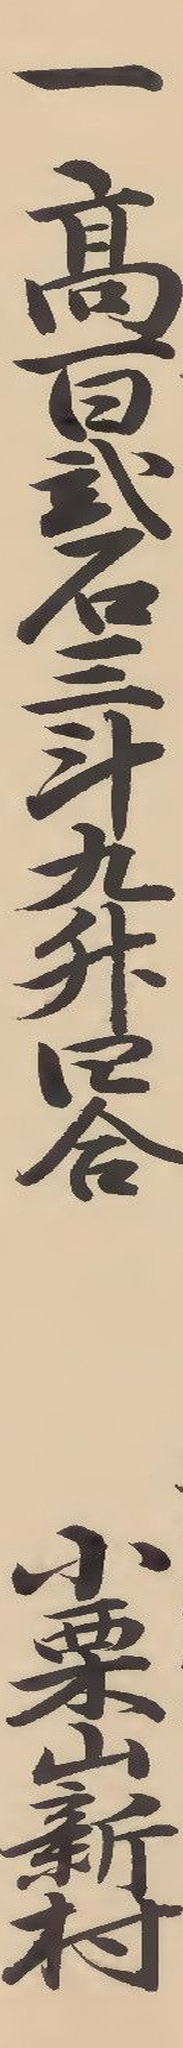一高百弐石三斗九升四合小栗新山村
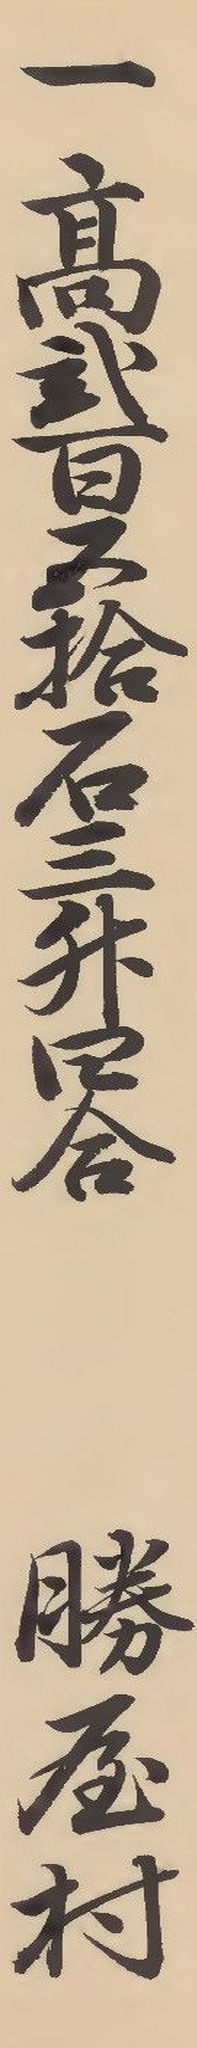一高弐百五拾石三升四合勝屋村
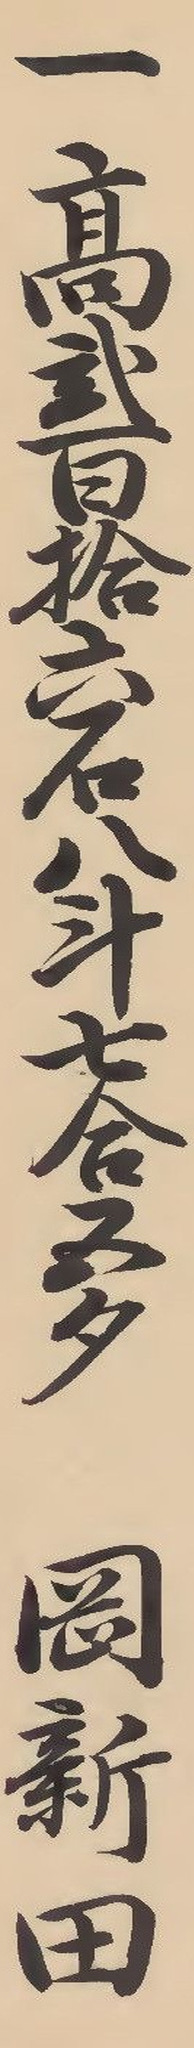一高弐百拾六石八斗七合五勺岡新田

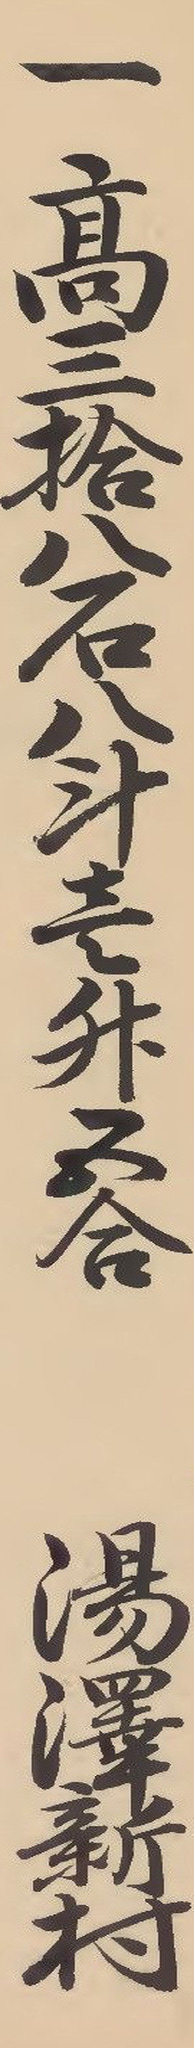一高三拾八石八斗壱升五合湯沢新村
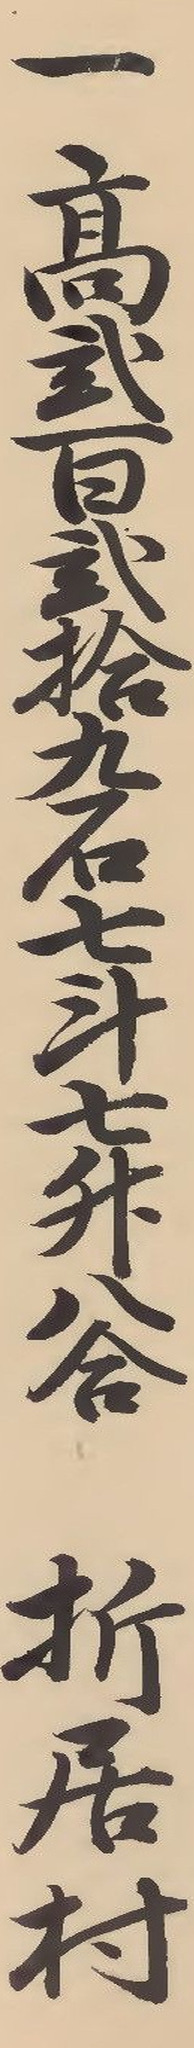一高弐百弐拾九石七斗七升八合折居村
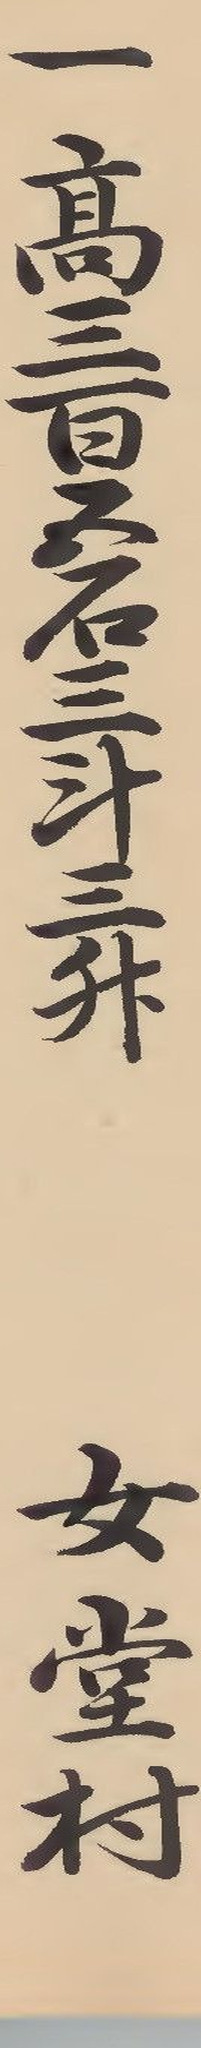一高三百五石三斗三升女堂村
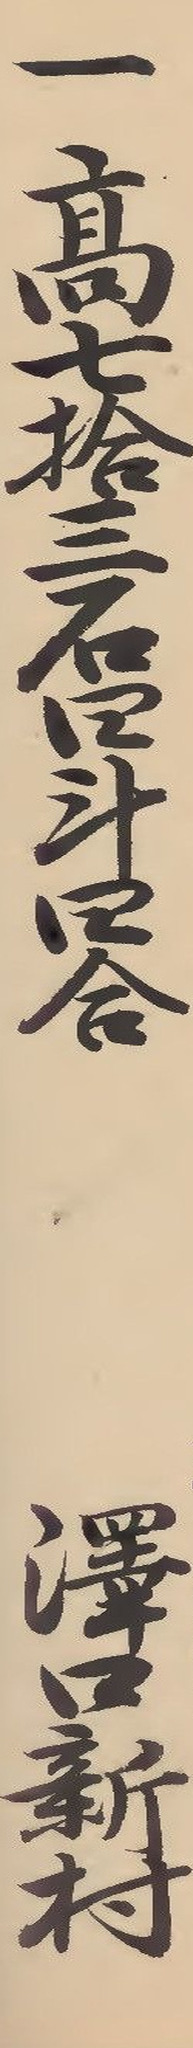一高七拾三石四斗四合沢口新村
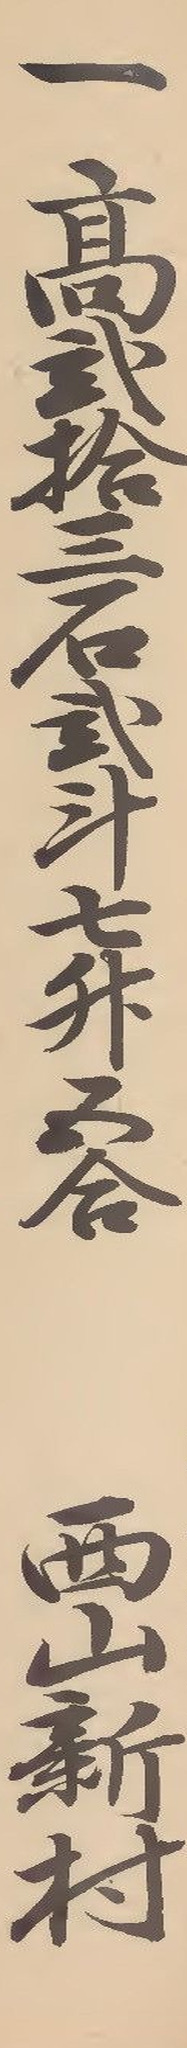一高弐拾三石弐斗七升五合西山新村
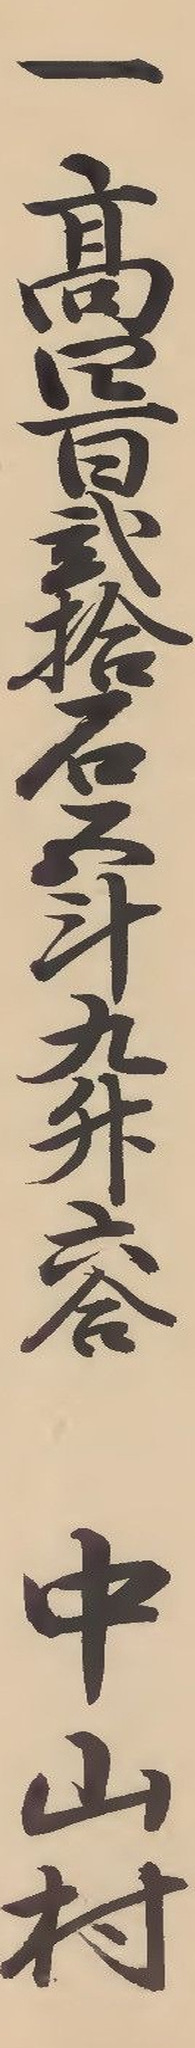一高四百弐拾石五斗九升六合中山村
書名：越後国郷帳　下
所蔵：国立公文書館 National Archives of Japan
